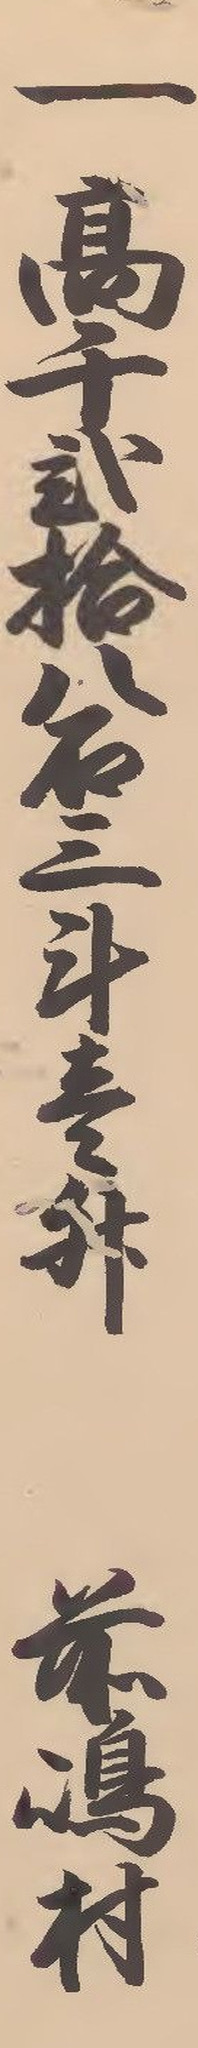一高千弐拾八石三斗壱升前島村

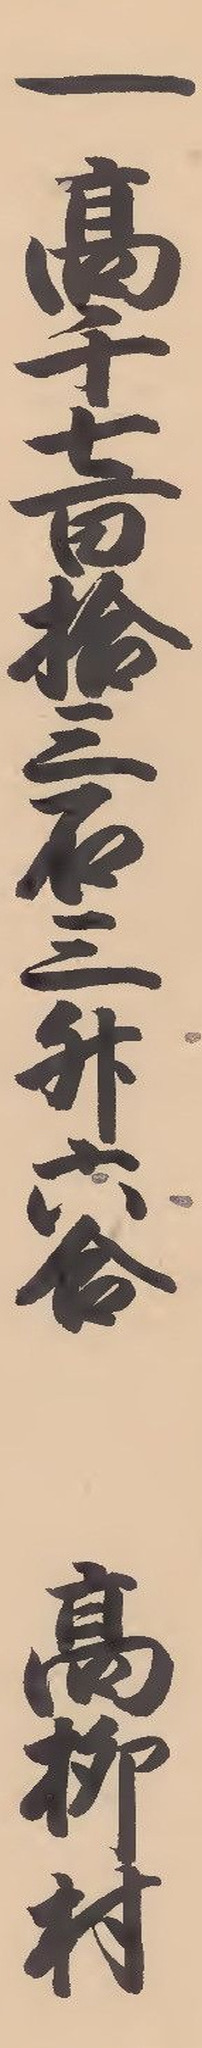一高千七百拾三石三升六合高柳村
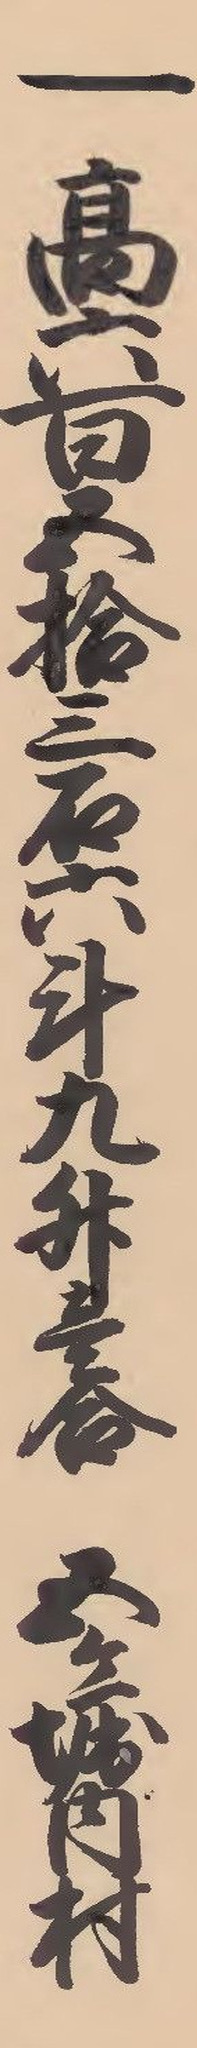一高六百五拾三石六斗九升壱合五ヶ堀内村
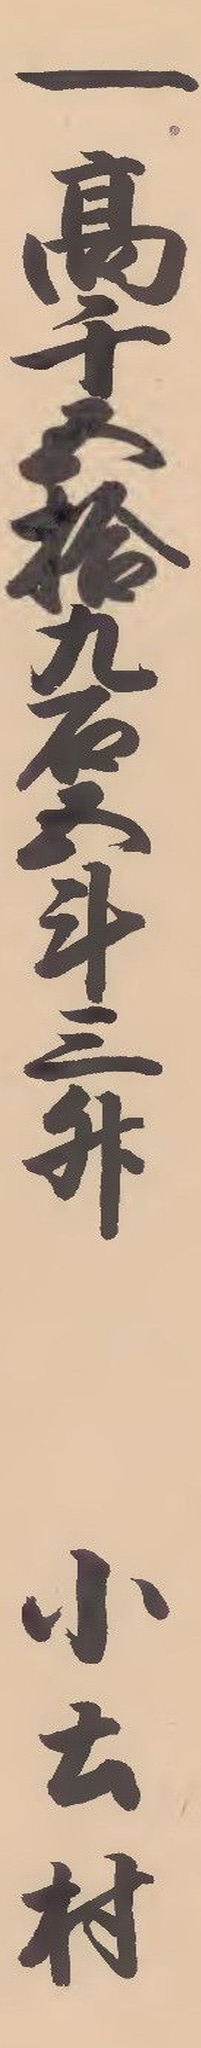一高千五拾九石五斗三升小土村
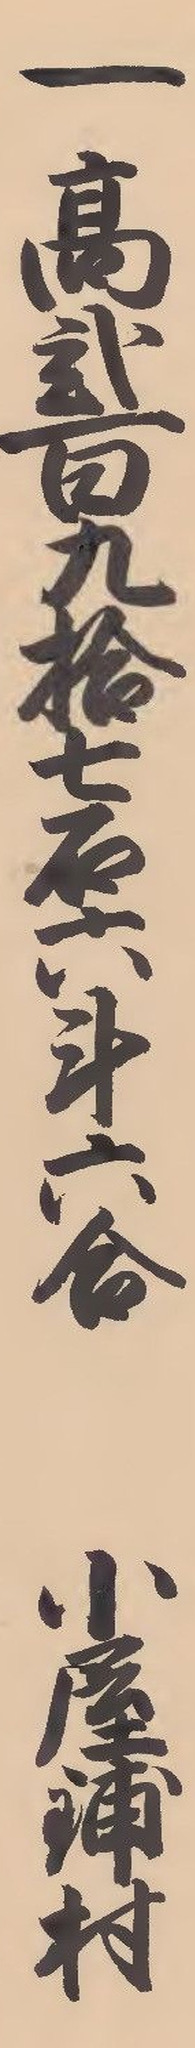一高弐百九拾七石六斗六合小屋鋪村
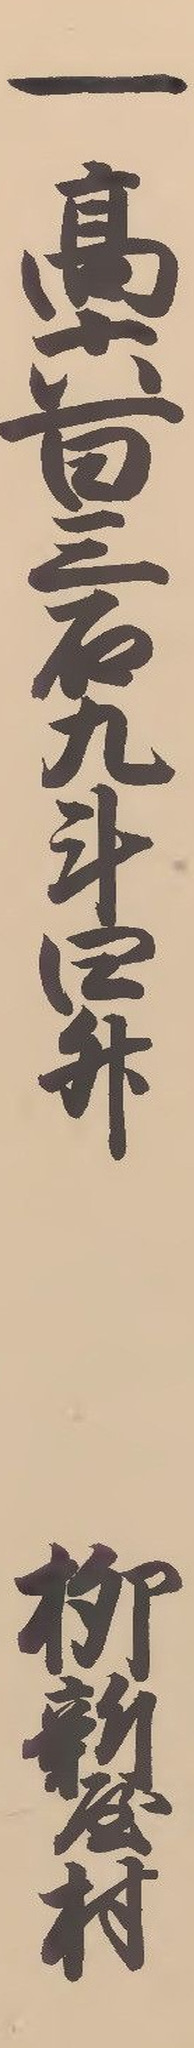一高六百三石九斗四升柳新屋村
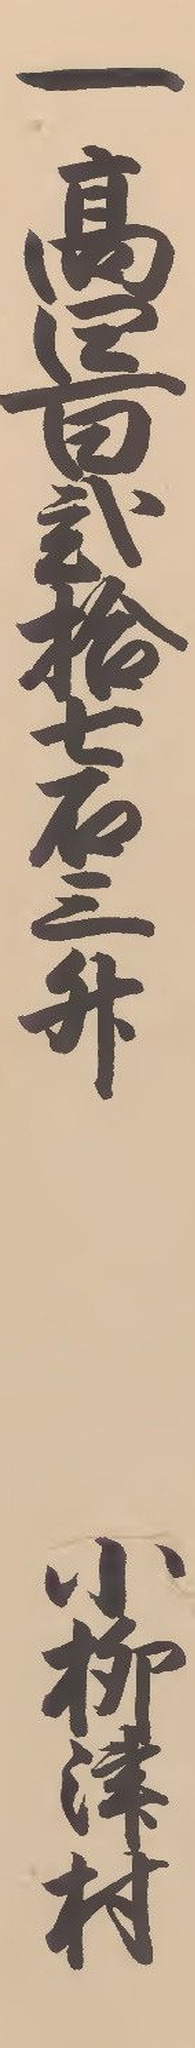一高四百弐拾七石三升小柳津村
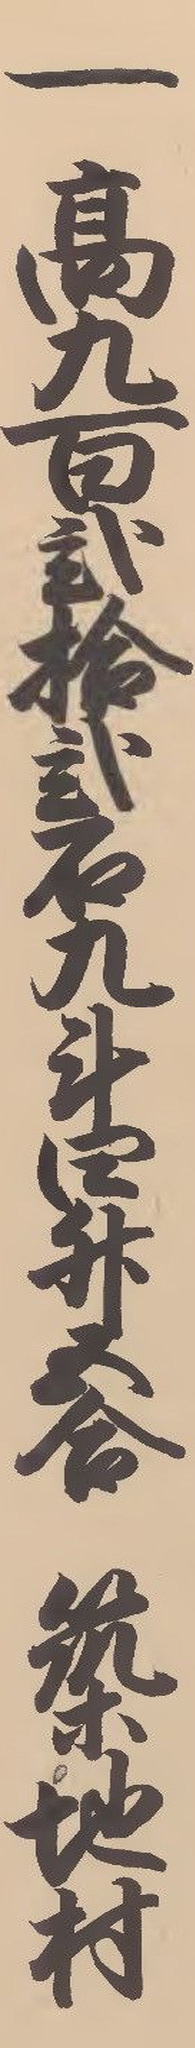一高九百弐拾弐石九斗四升五合築地村
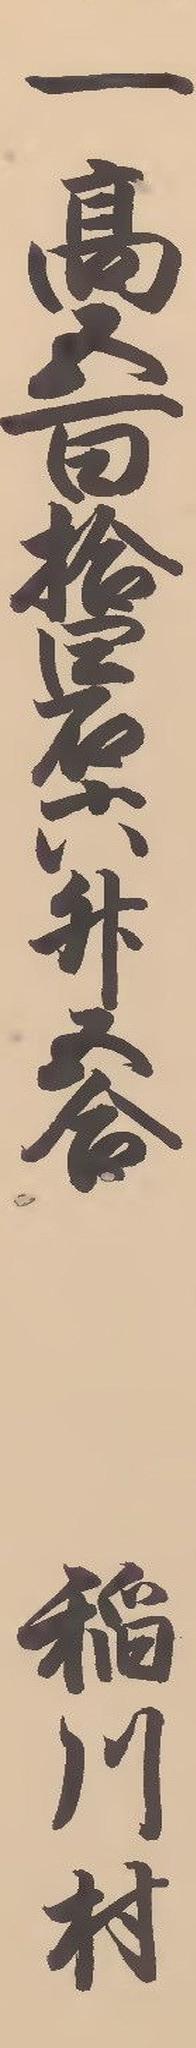一高五百拾四石六升五合稲川村

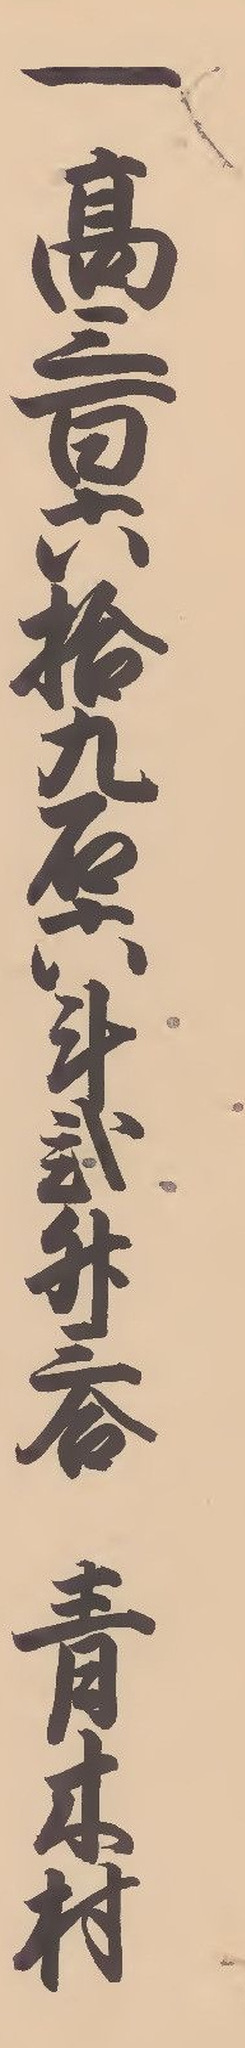一高三百六拾九石六斗弐升三合青木村
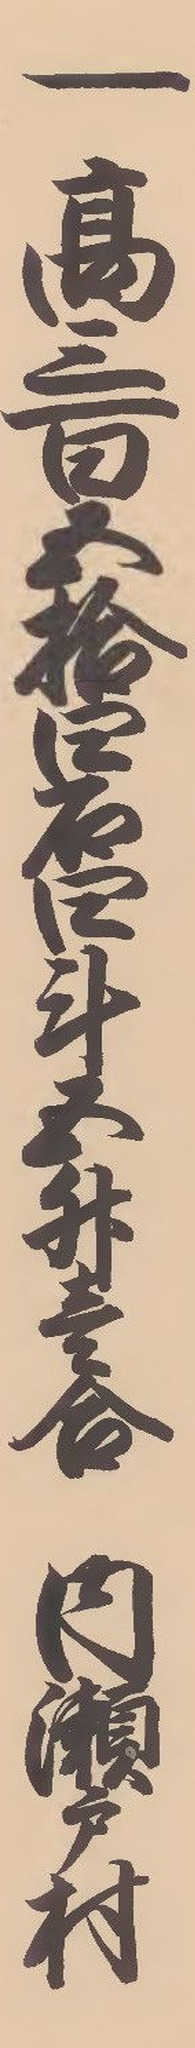一高三百五拾四石四斗五升壱合内瀬戸村
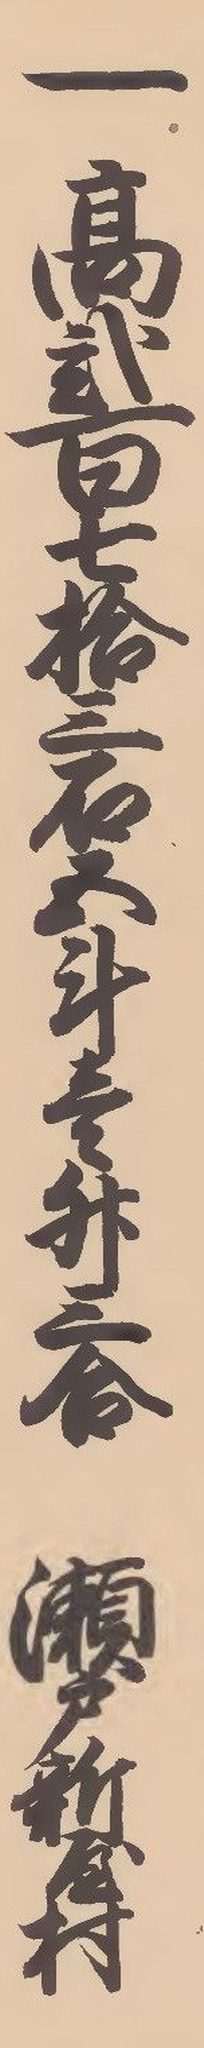一高弐百七拾三石五斗壱升三合瀬戸新屋村
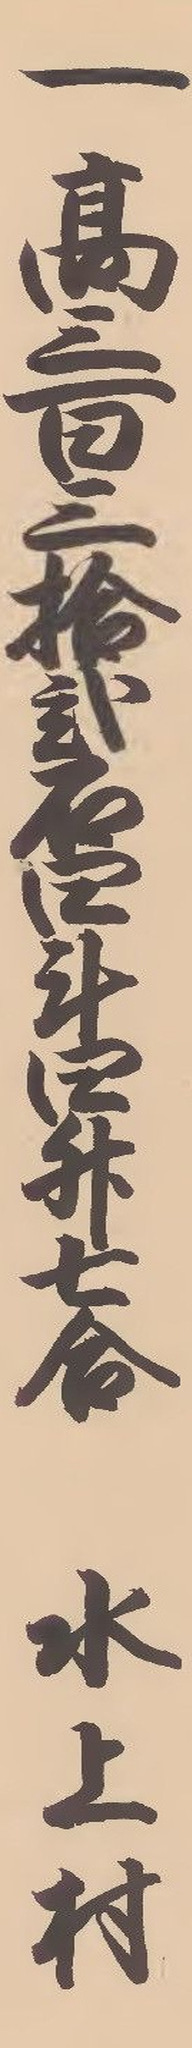一高三百三拾弐石四斗四升七合水上村
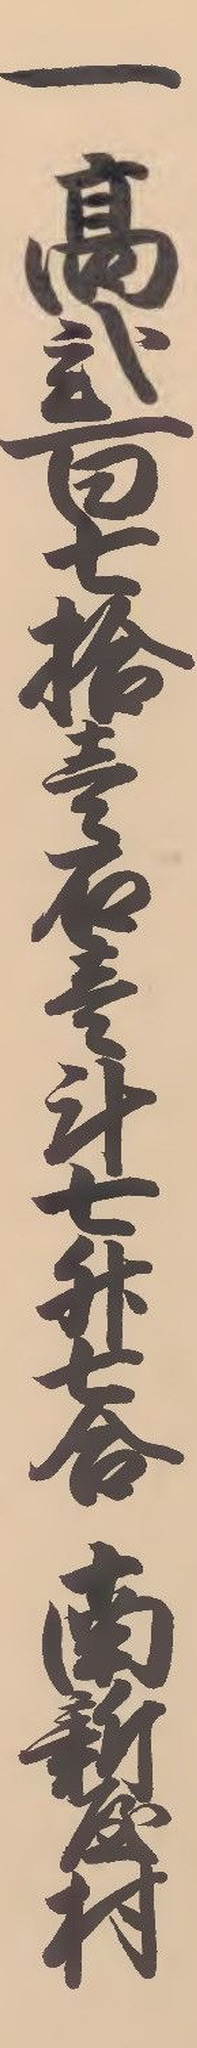一高弐百七拾壱石壱斗七升七合南新屋村
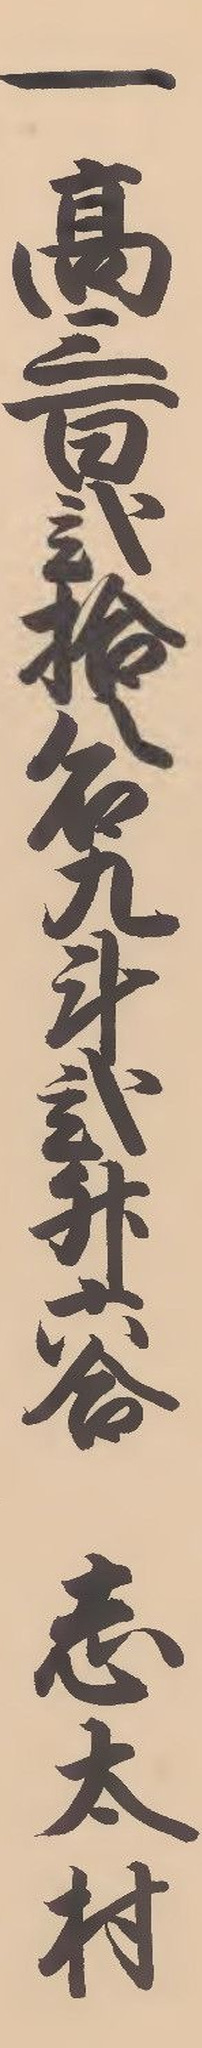一高三百弐拾八石九斗弐升六合志太村
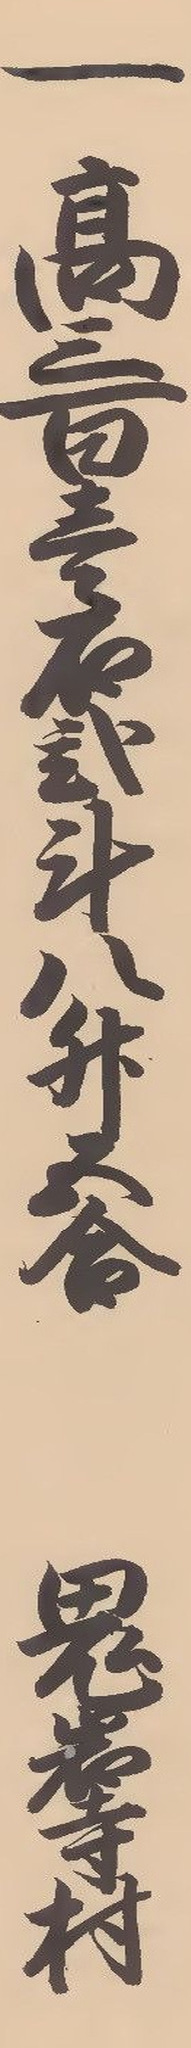一高三百壱石弐斗八升五合鬼岩寺村
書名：駿河国郷帳
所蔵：国立公文書館 National Archives of Japan
